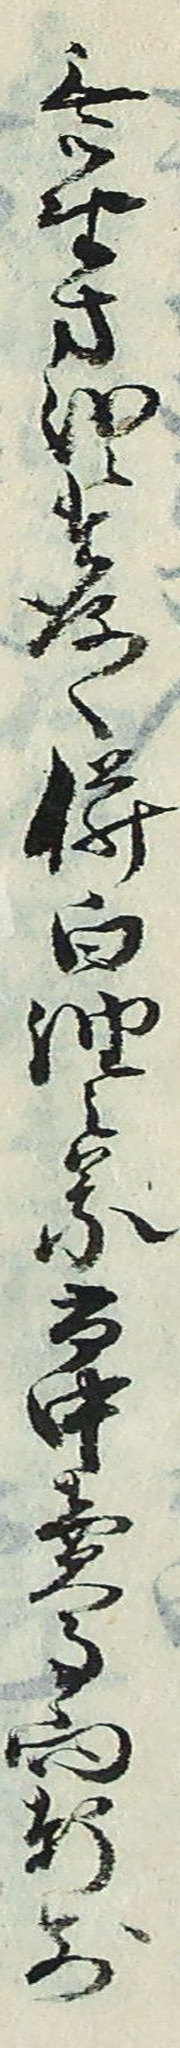無御坐方哉に奉存候併白油之義市中売手向軒別
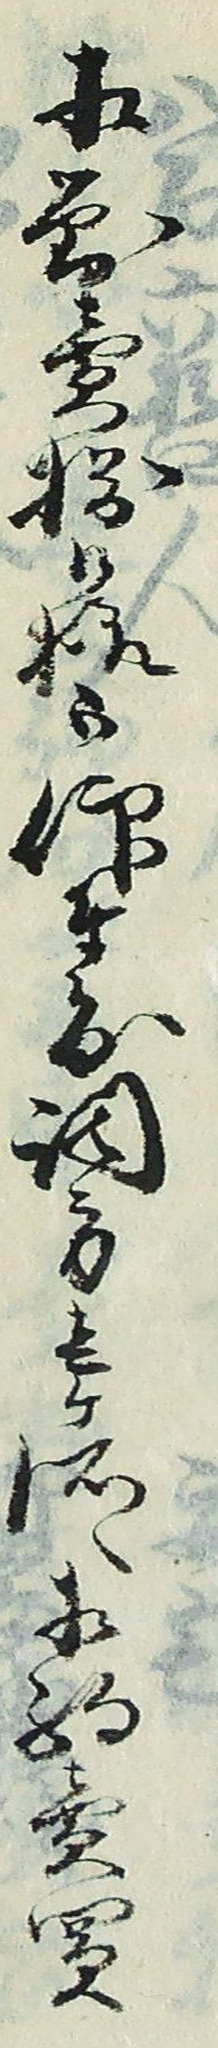相対売捌候様被仰付度調方壱ケ所へ相約売買
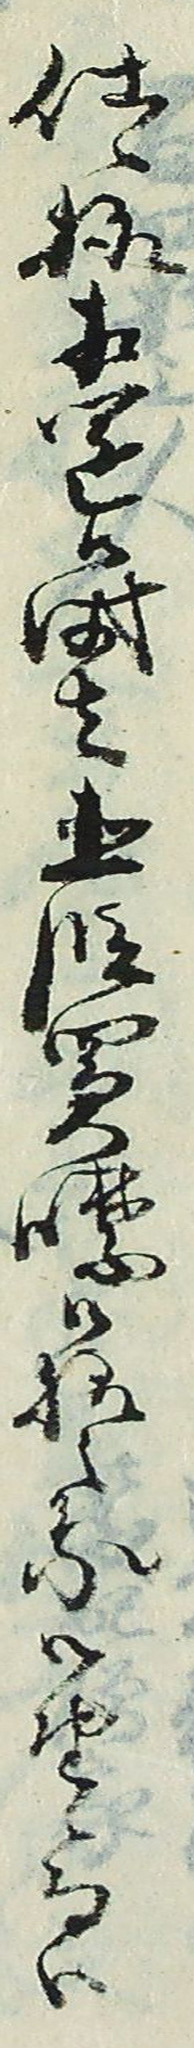仕候様相運候時者直段噤候様之義御坐候而は
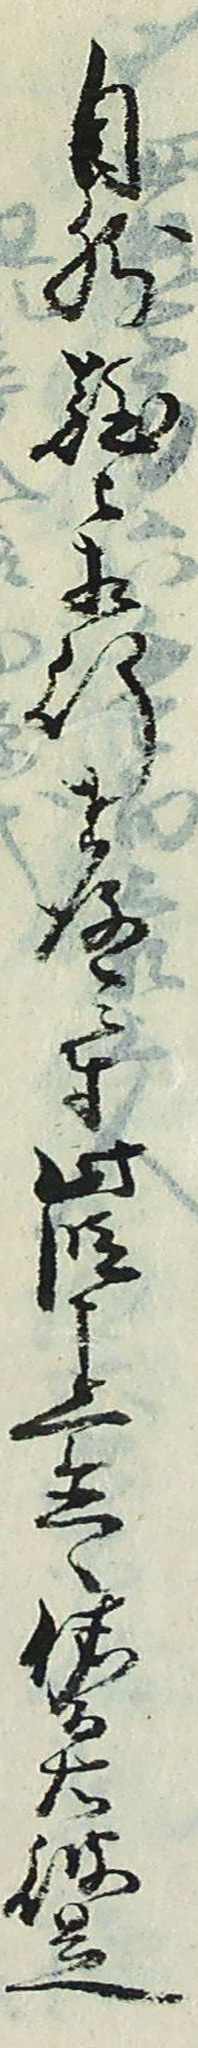自然難被相行奉存候に付此段申上置候依而右彼是
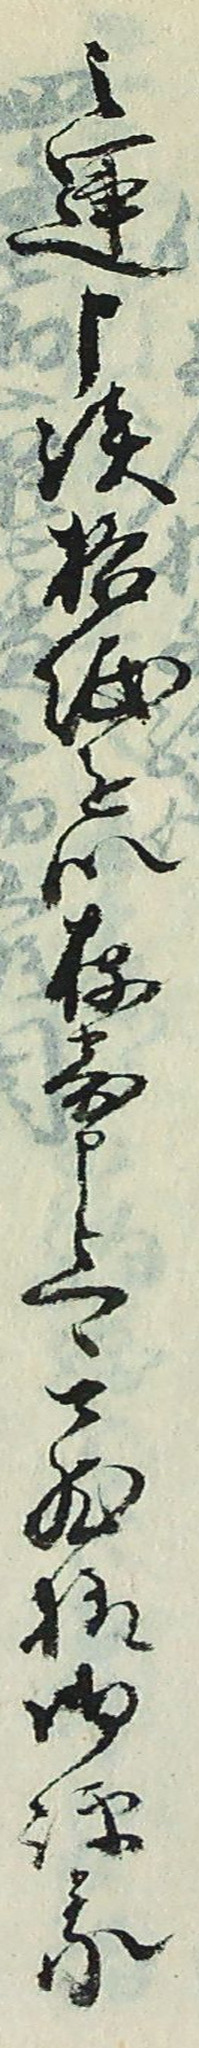之運申談格紙を以存寄申上候可然御評義
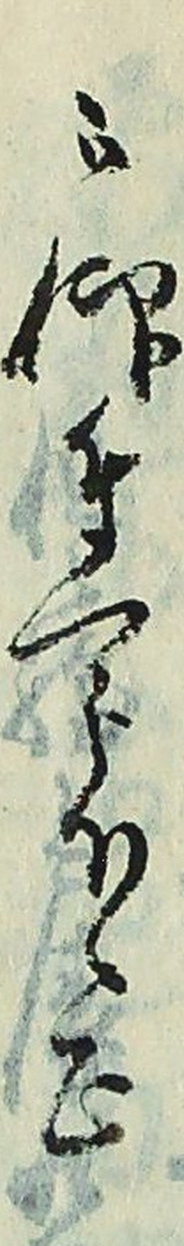被仰付可被下候以上
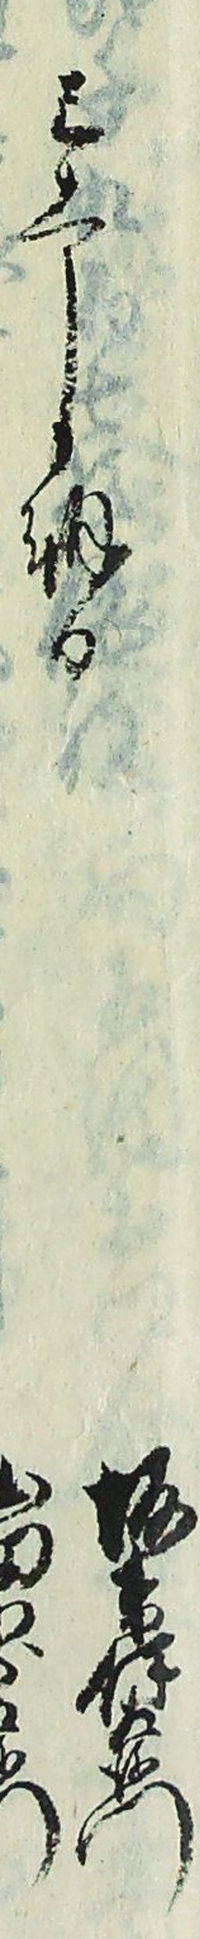巳十一月朔日坂東伊左衛門
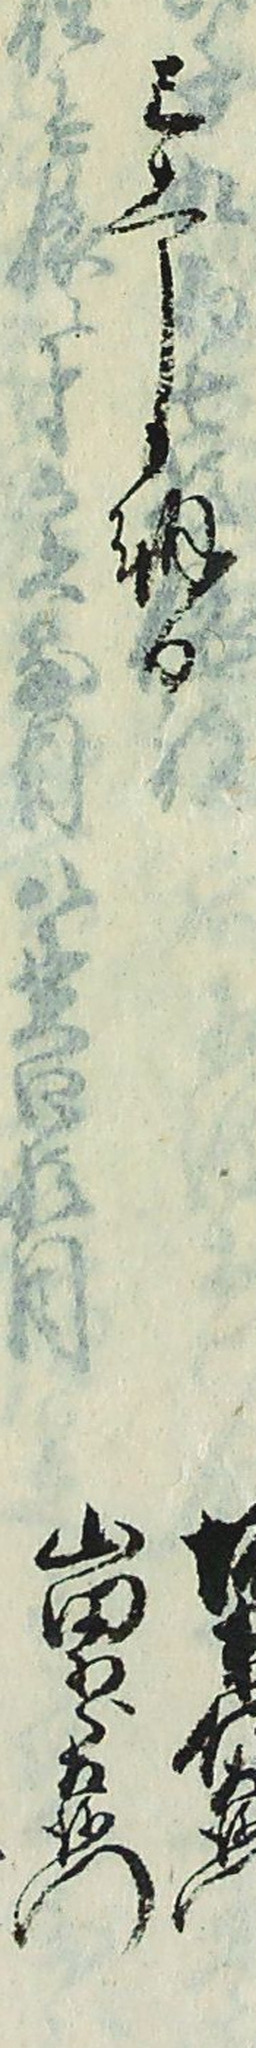巳十一月朔日坂東伊左衛門
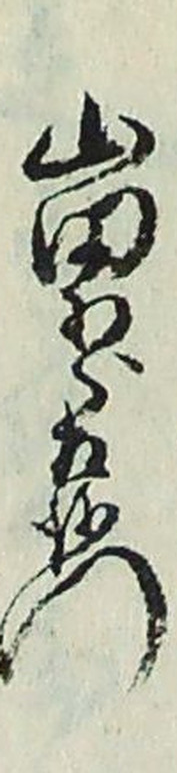山田五郎左衛門
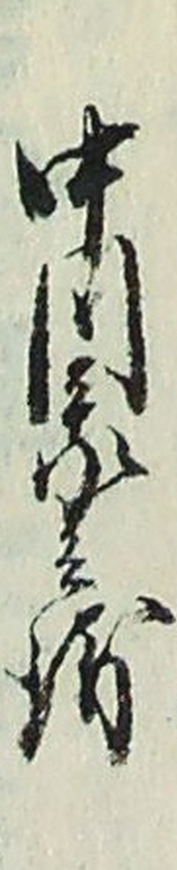中内義兵衛
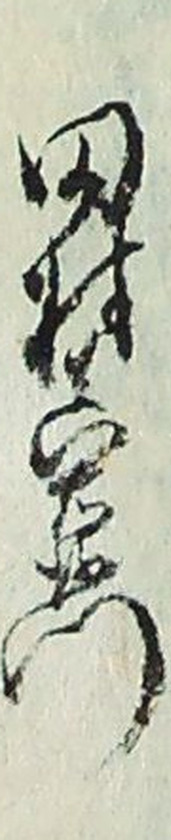田村真右衛門
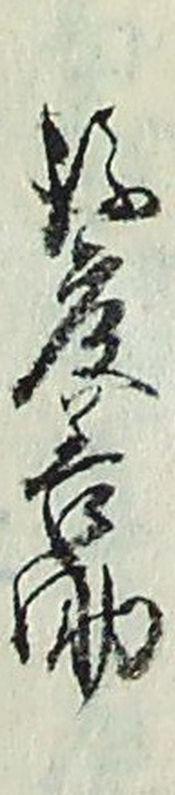後藤善助
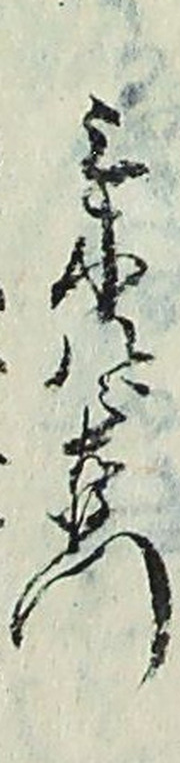三木八郎右衛門
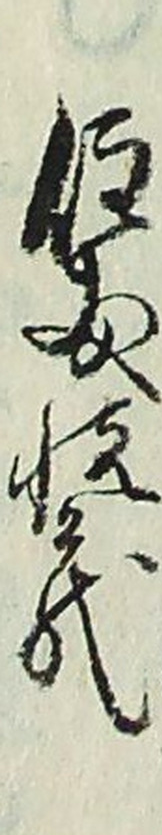住友悦蔵
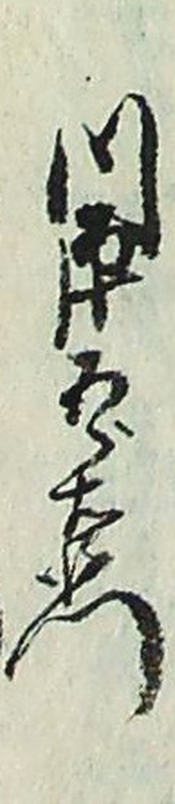川原五郎右衛門
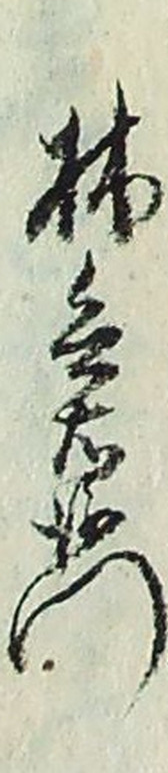林兵右衛門
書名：油稼御取究ニ附御箇條書テ以被仰渡南北同役申談御答書控
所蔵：鳴門教育大学 Naruto University of Education
